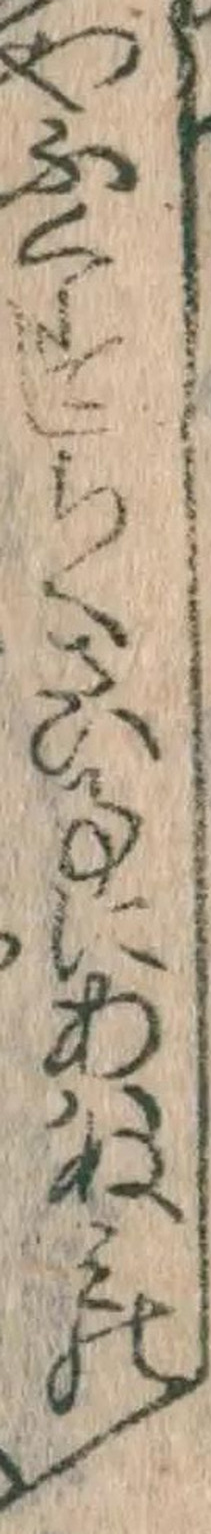やふくすしちくさい事にあはぬみの
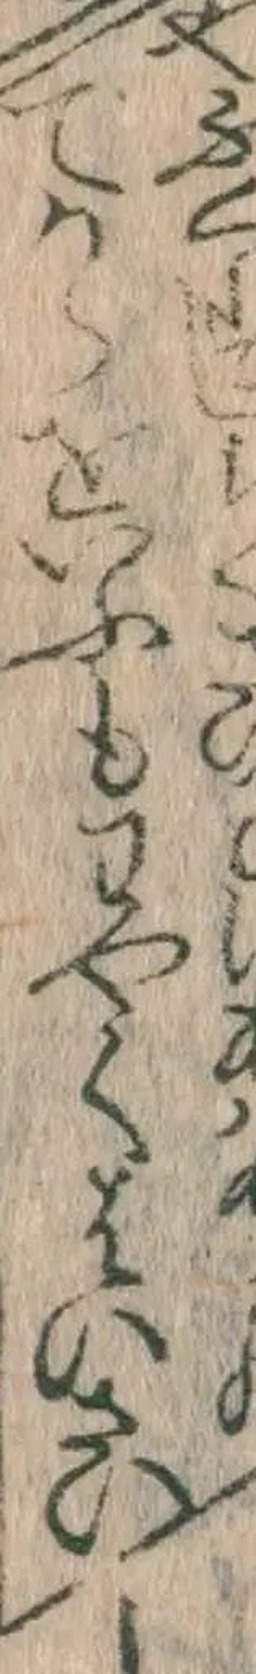てからをいふもわやくはいさい
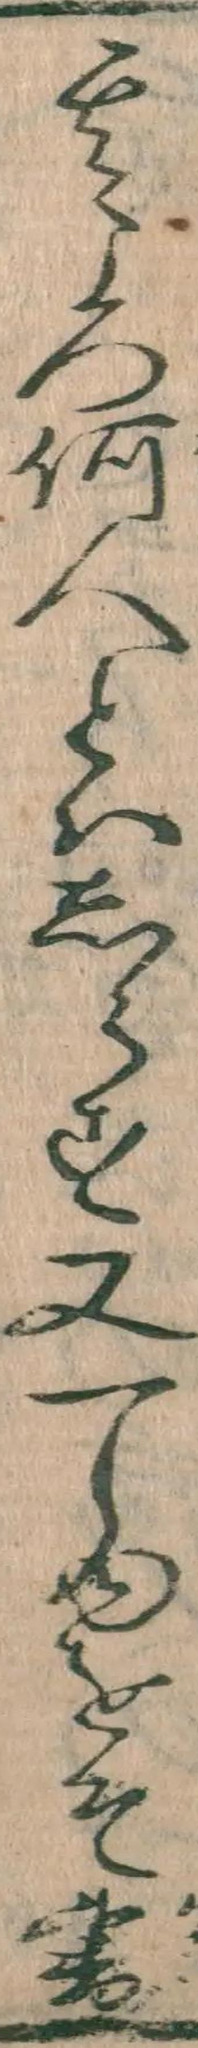其ころ何人とはしらす又一しゆをそ書
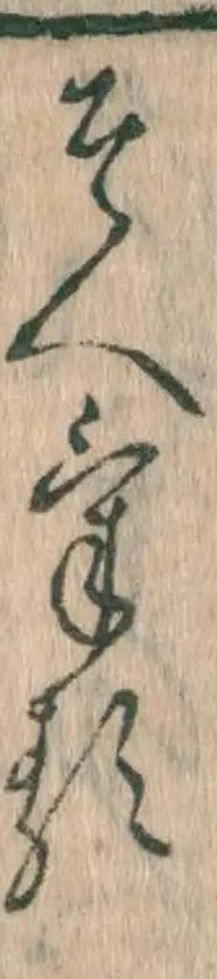そへける
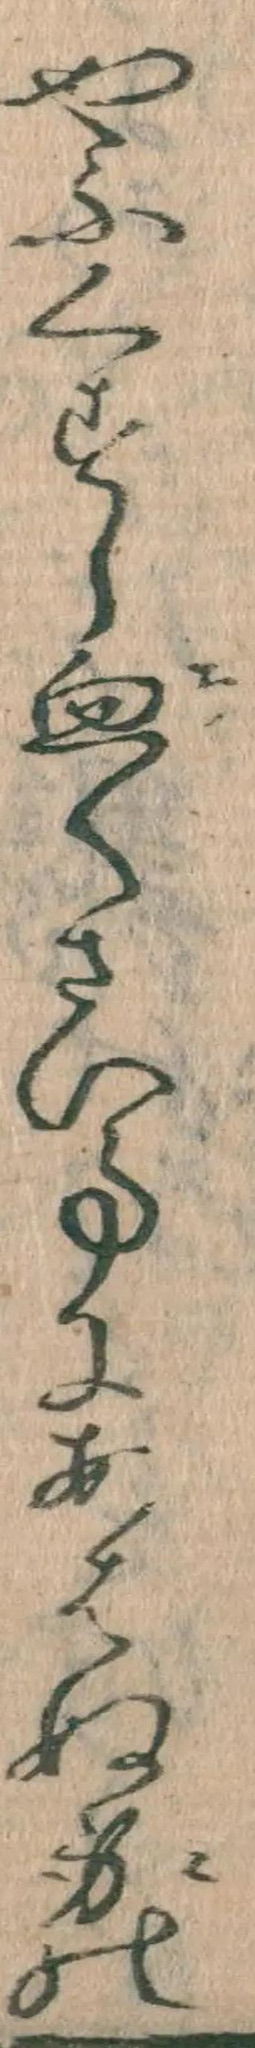やふくすし血くさい事にあはぬ身の
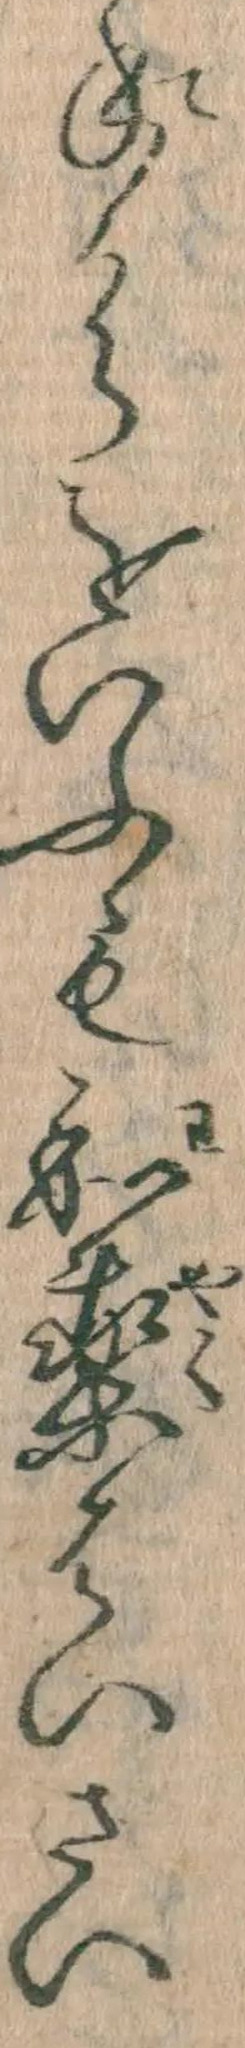手からをいふも和薬はいさい
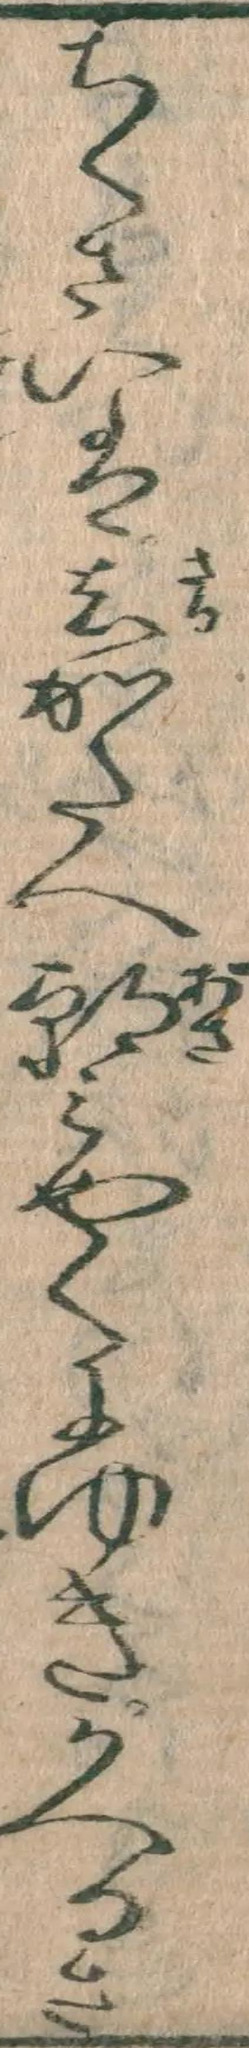ちくさいは去かたへ朝みやくにゆき。かへるさ
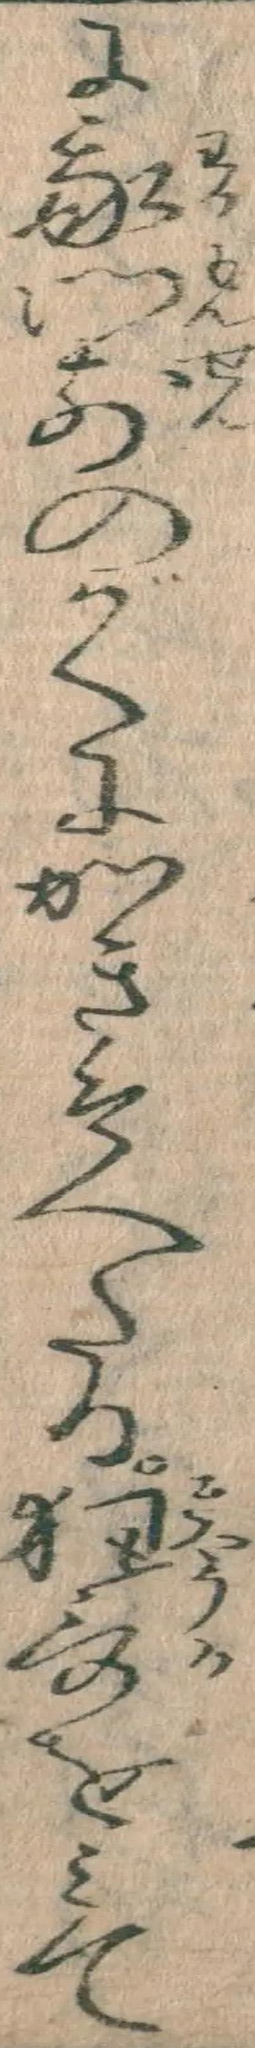に我門前のがくにかきそへたる。狂哥をみて
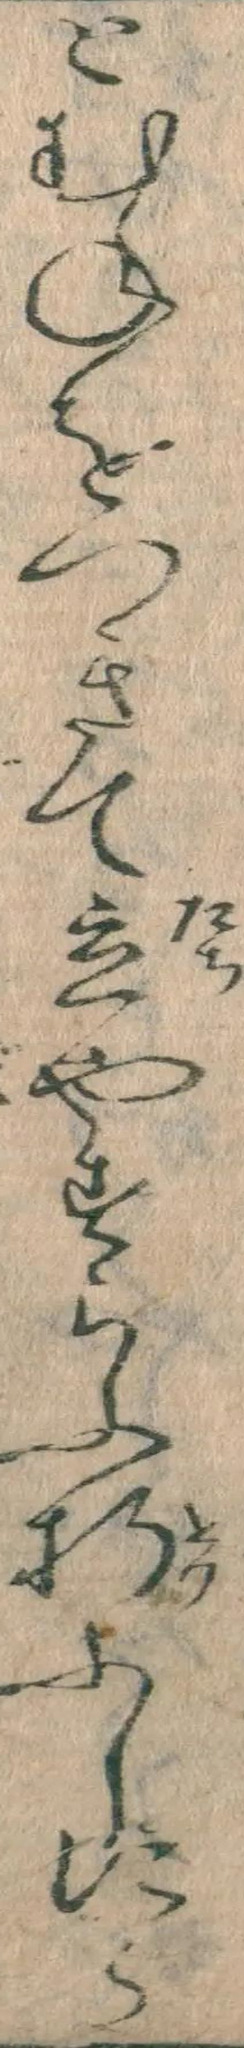とむねをつきて立やすらふ折ふしにら
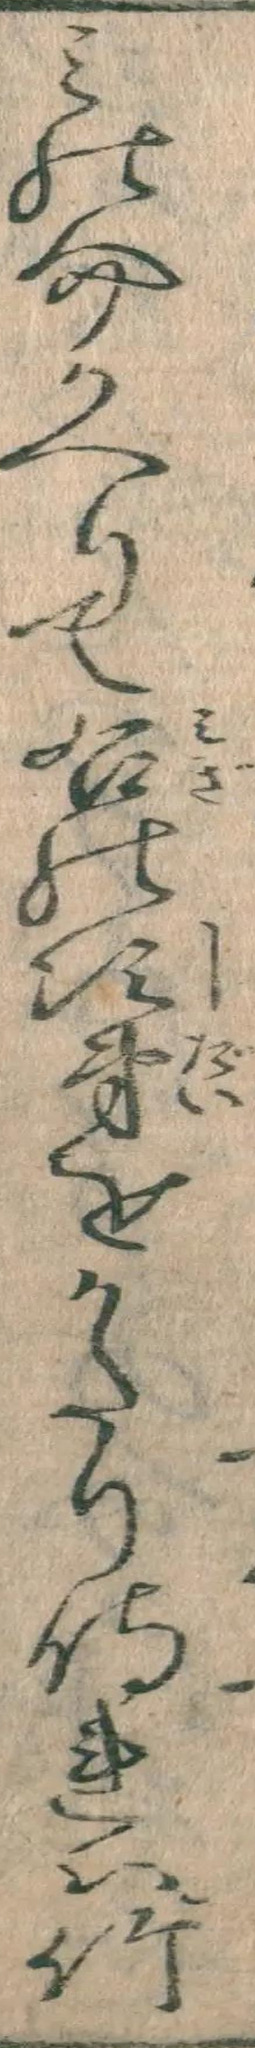みの介かへりて右の次第をかたり侍れは。竹
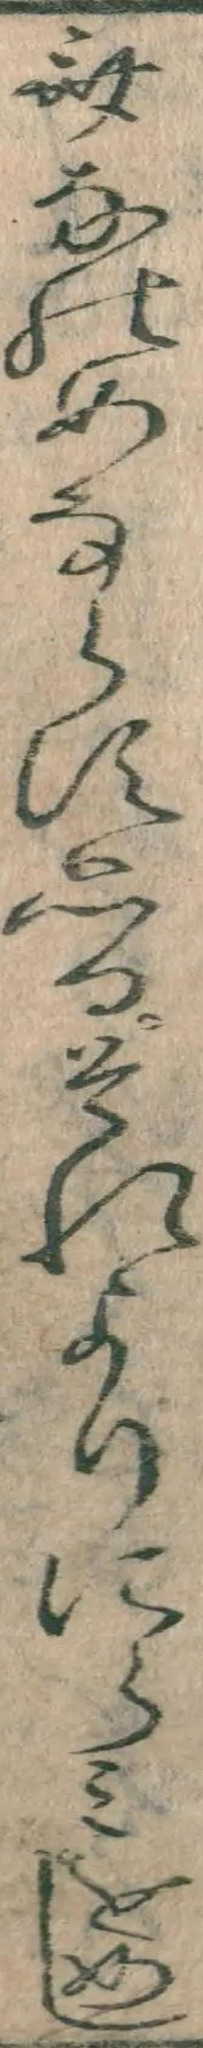斎なのめならす思ひ。それよりにらみをめし
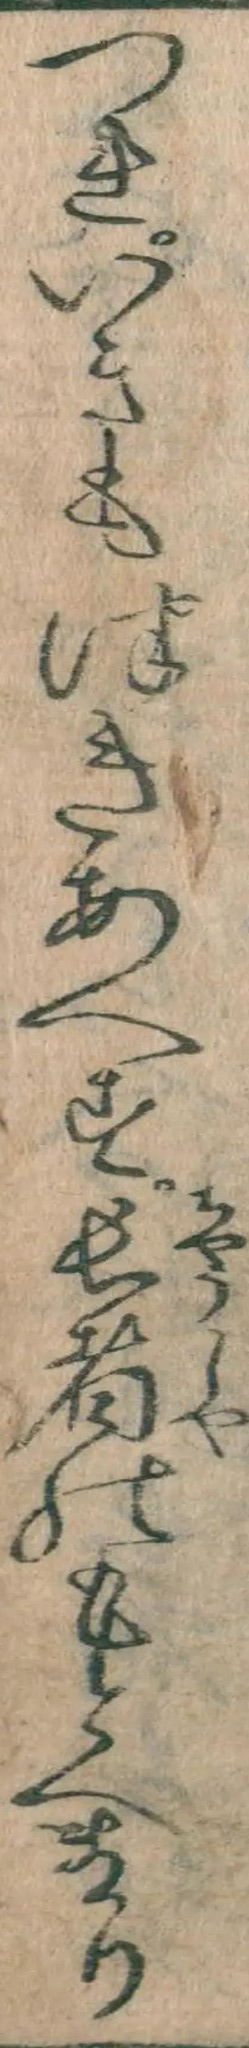つれ。いきもつきあへす。長者のもとへまかり

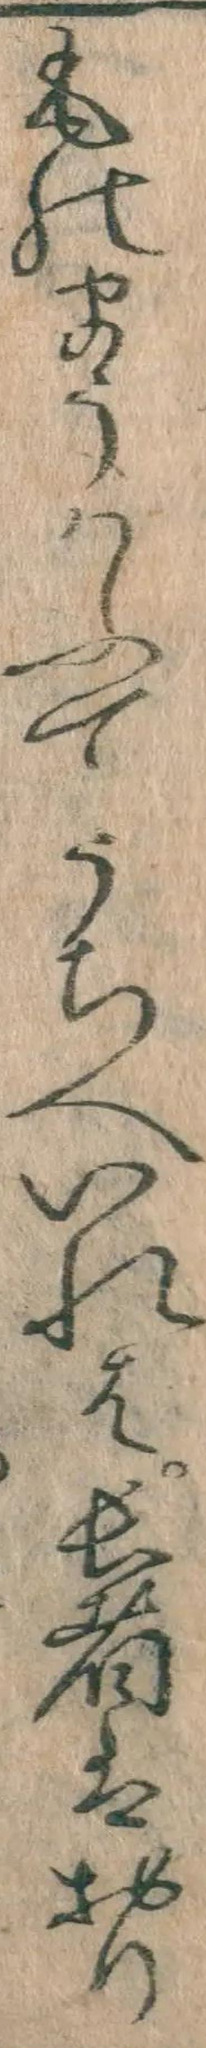ものまうはふてうちへいれは。長者はおり
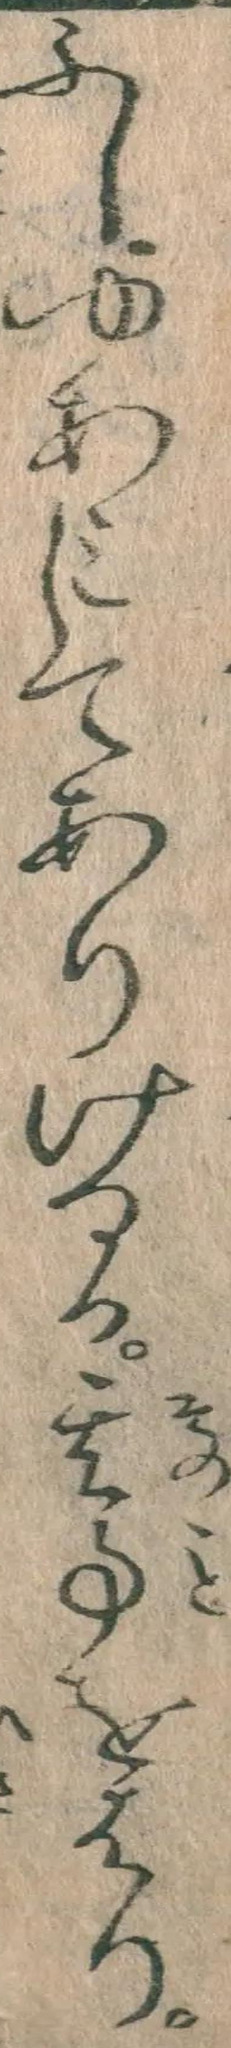ふし、ゆあみしてありけるか。其事をはり。
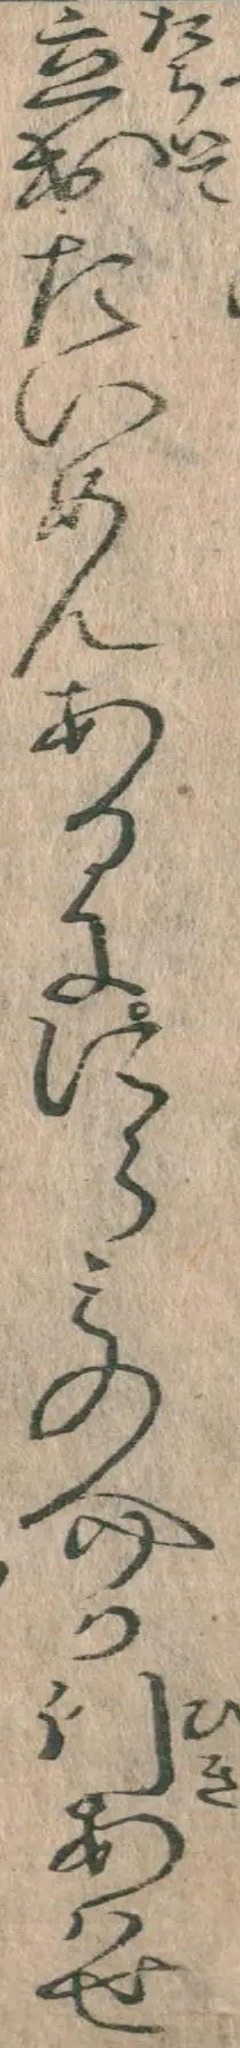立出たいめんあるに。にらみの介か引あはせ
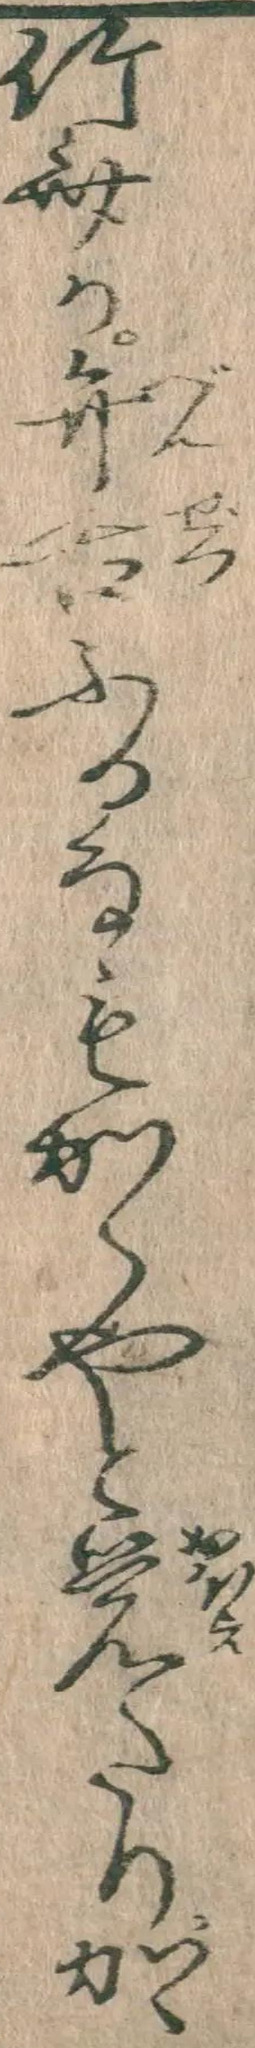竹斎か。弁舌ふるなもかくやと覚たり。かゝ
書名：竹斎狂歌物語 3巻
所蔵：国立国会図書館 National Diet Library, JAPAN
